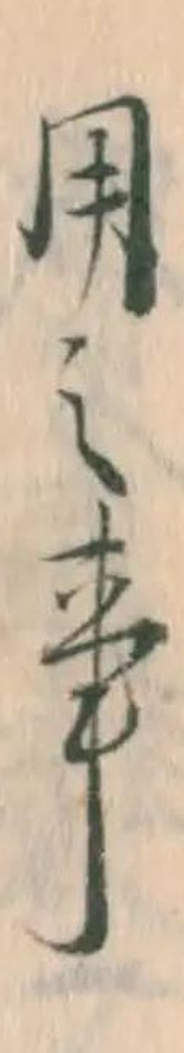用之事
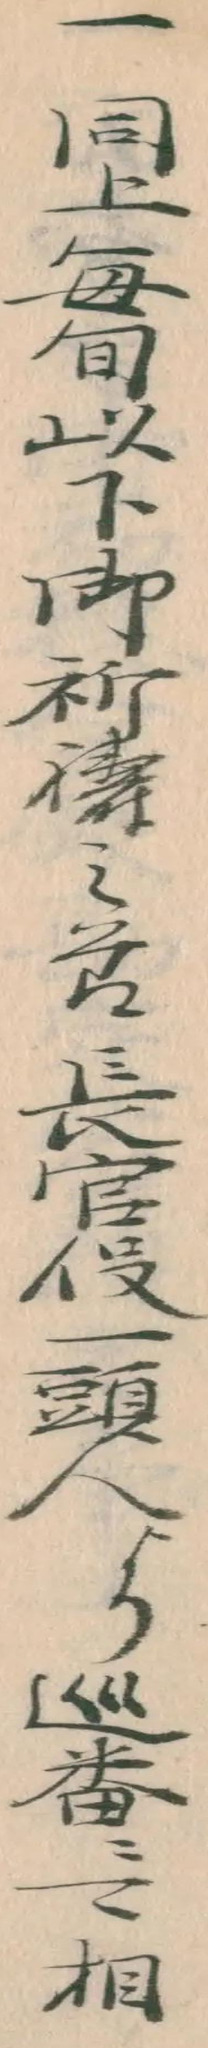一同上毎旬以下御祈祷之節長官役一頭人より巡番ニ可相
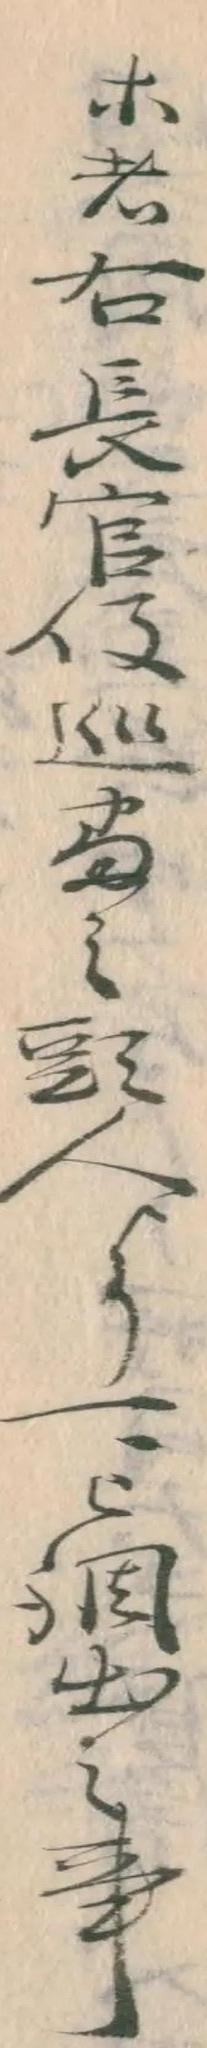等は右長官役巡番之頭人より可被調出之事
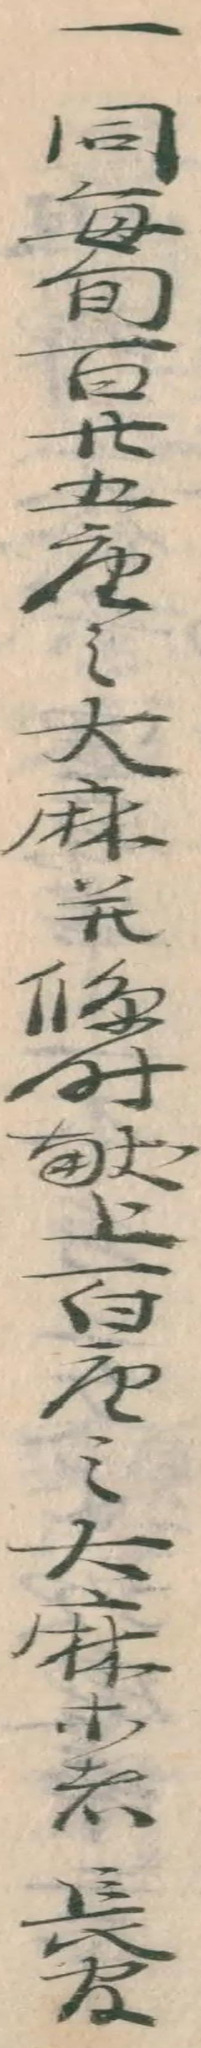一同毎旬百廿五座之大麻并臨時献上百座之大麻等は長官
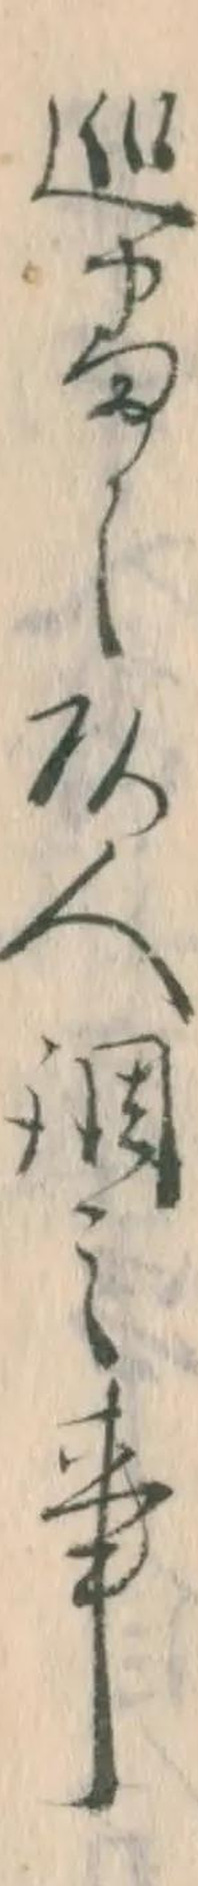巡番之頭人調之事
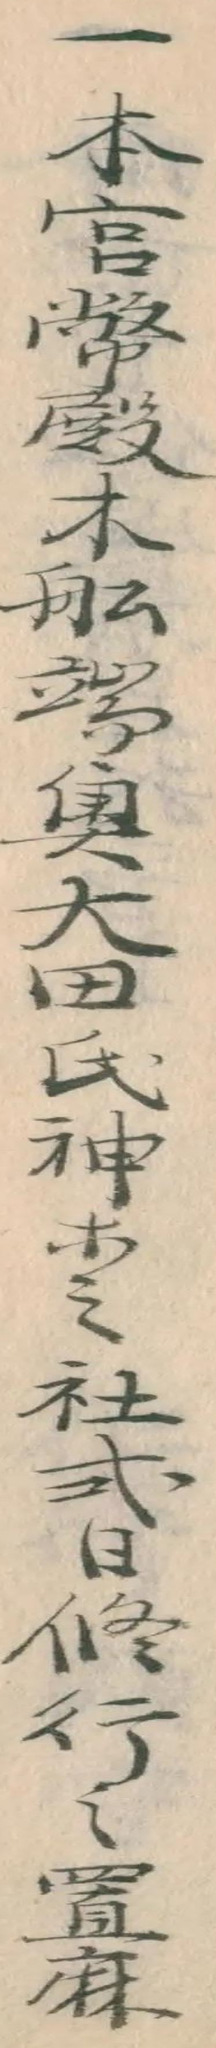一本宮幣殿木舩端奥大田氏神等之社式日修行之置麻
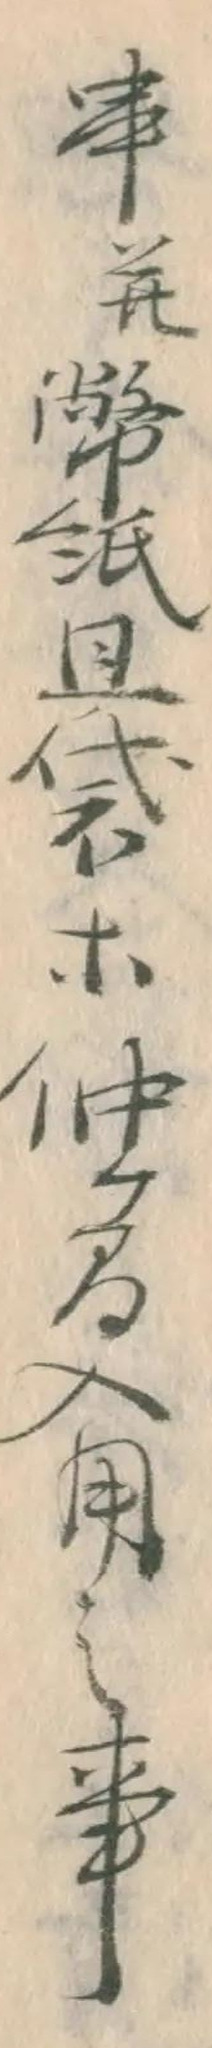串幷幣紙且袋等仲ヶ間入用之事
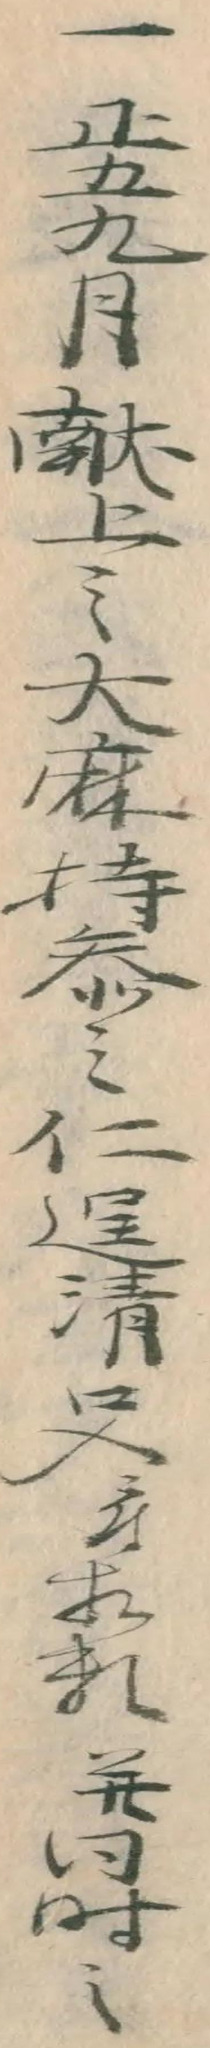一正五九月献上之大麻持参之仁逞清口入ニ付相頼并同時之

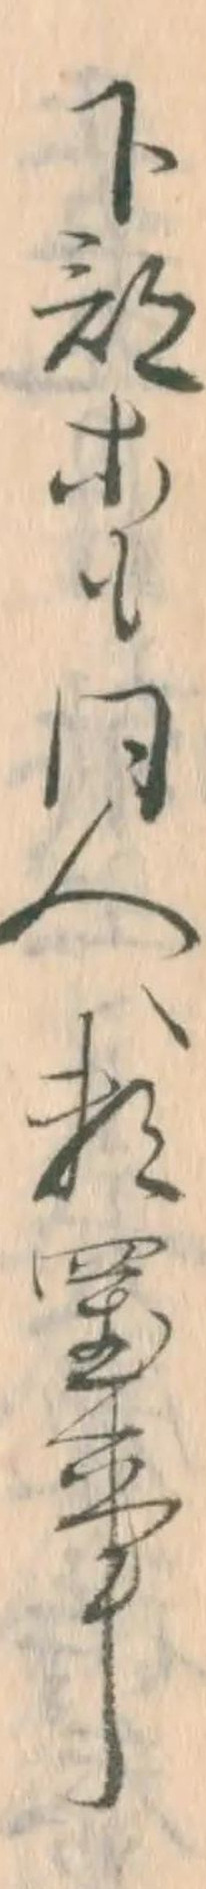下部等も同人へ頼置事
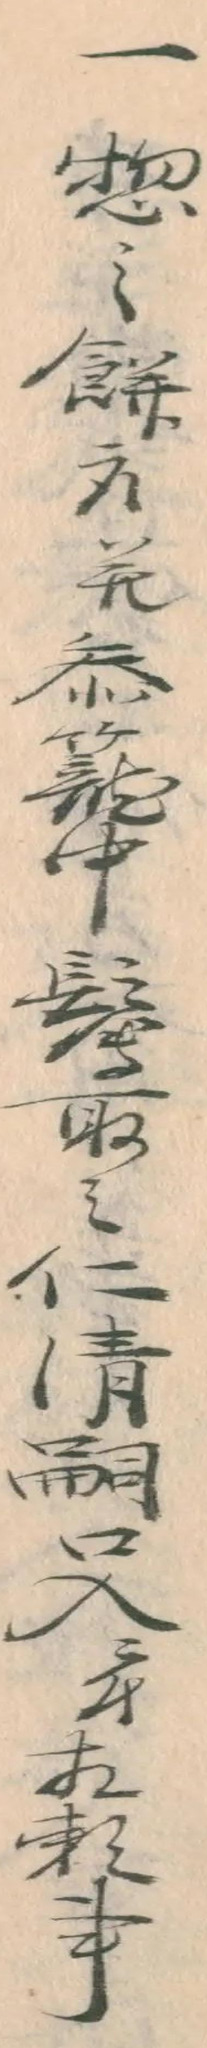一惣之餅取并参籠中鬠取之仁清嗣口入ニ付相頼事
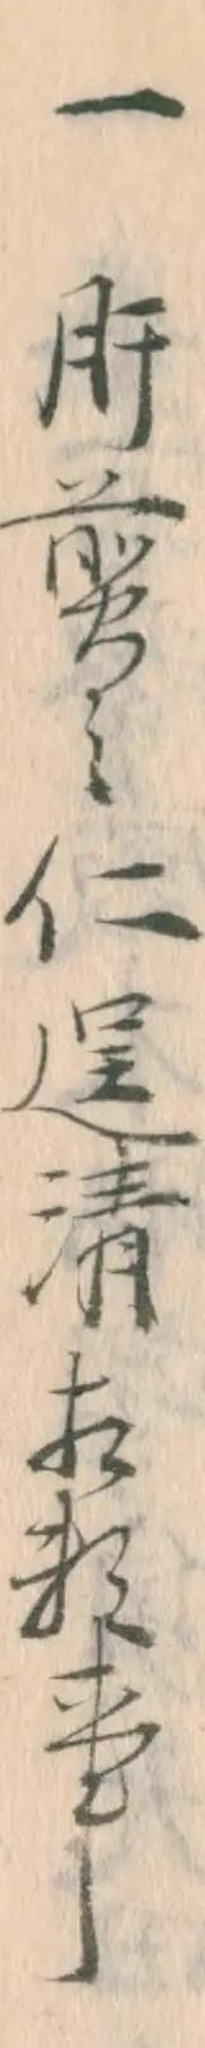一肝煎之仁逞清相頼事
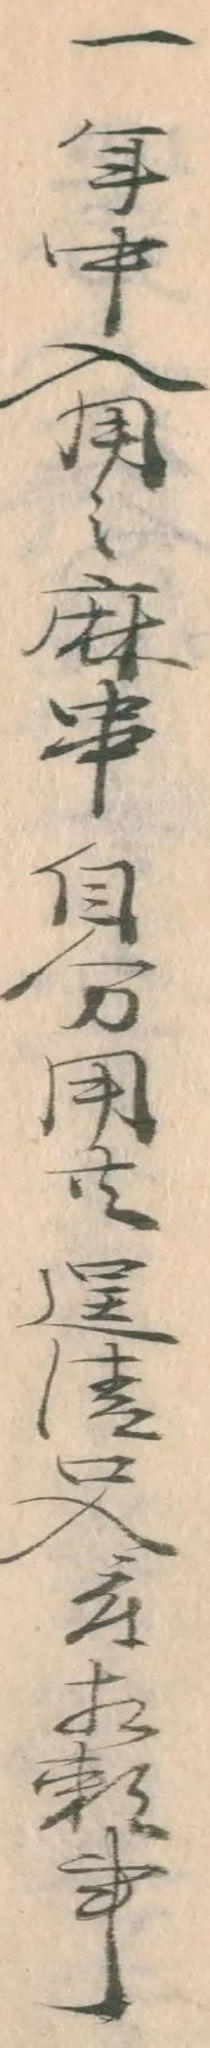一年中入用之麻串自分用共逞清口入ニ付相頼事
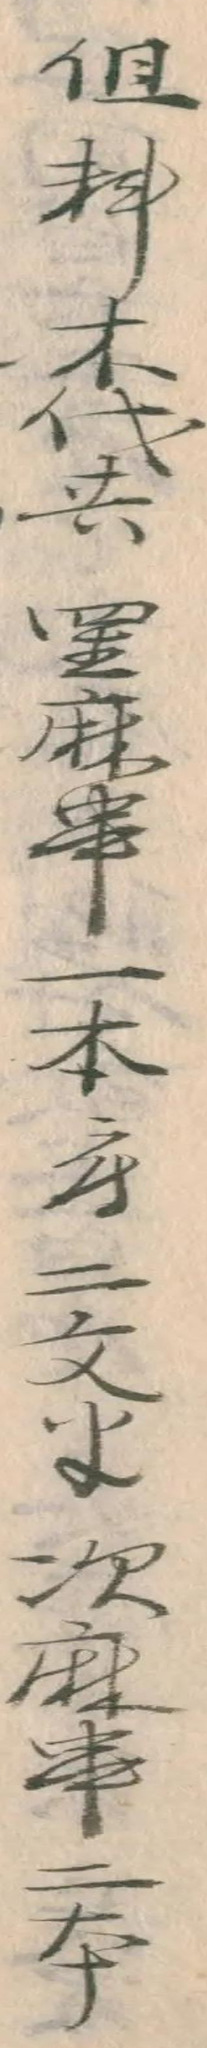但料木代共置麻串一本ニ付二文半次麻串二本
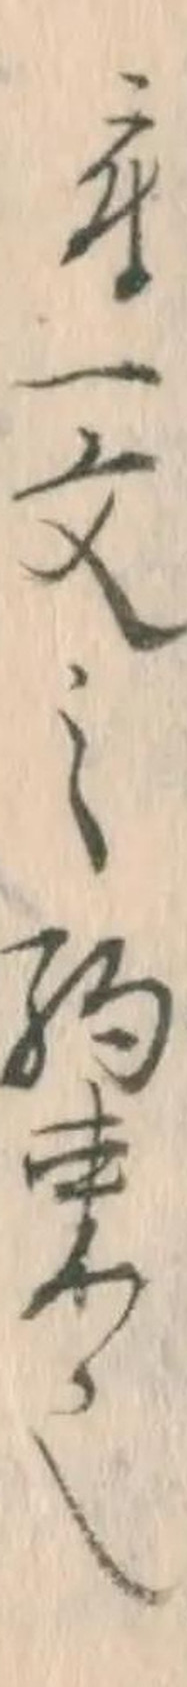ニ付一文之約束也
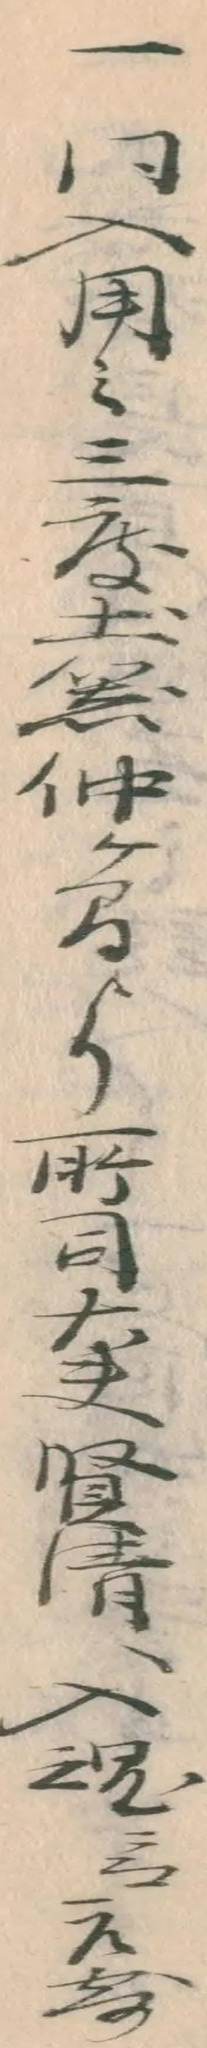一同入用之三度土器仲ヶ間より所司大夫賢清へ入魂ニ而取寄
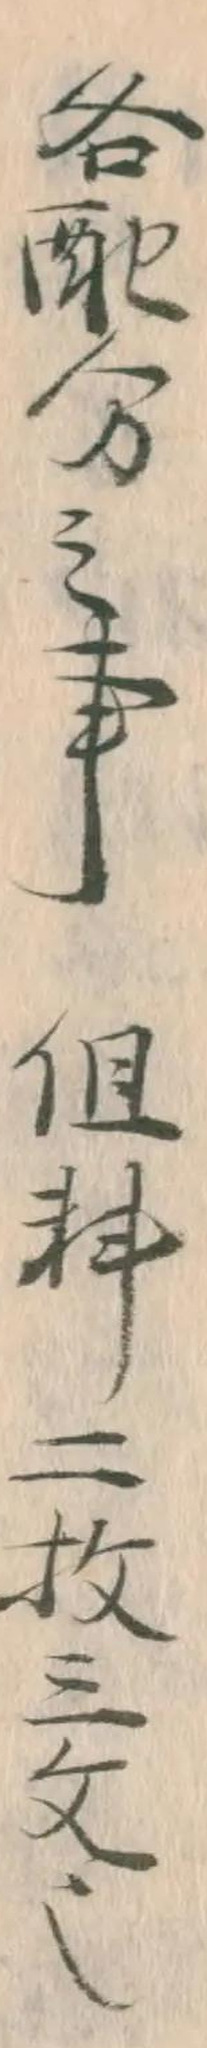各配分之事但料二枚三文也
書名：賀茂社記録. 第72冊
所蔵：国立国会図書館 National Diet Library, JAPAN
